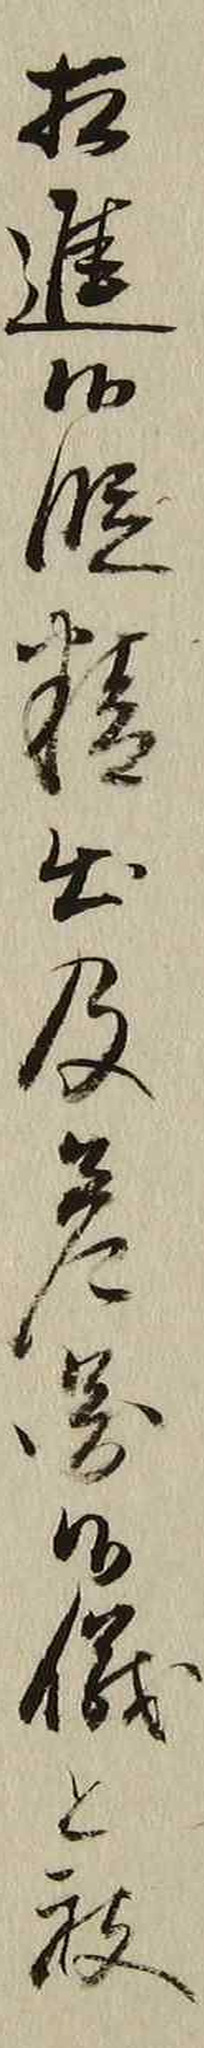相進候段精出及差図候儀と被
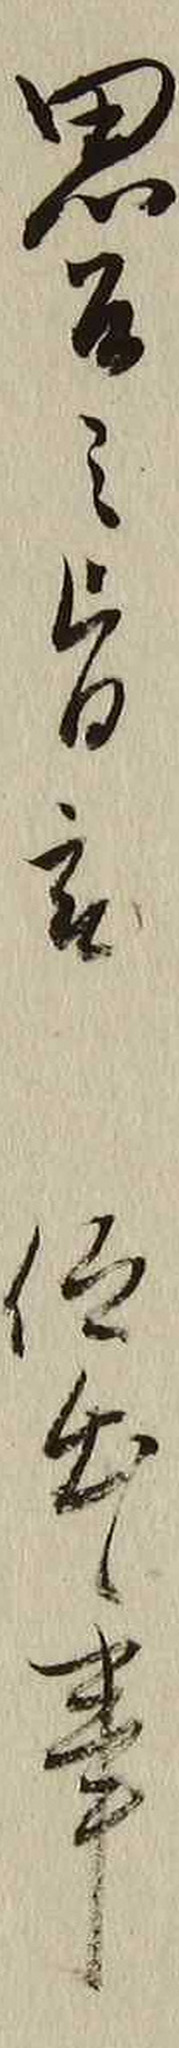思召之旨被仰出候事
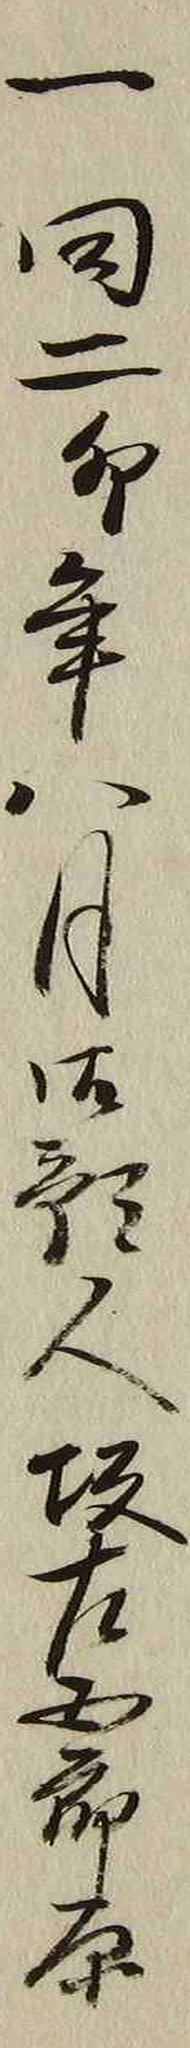一同二卯年八月御預人坂左五郎原
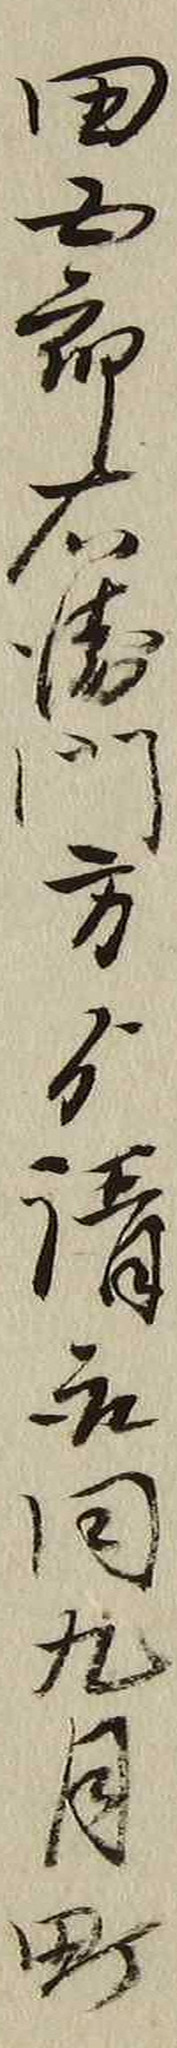田五郎右衛門方ゟ請取同九月町
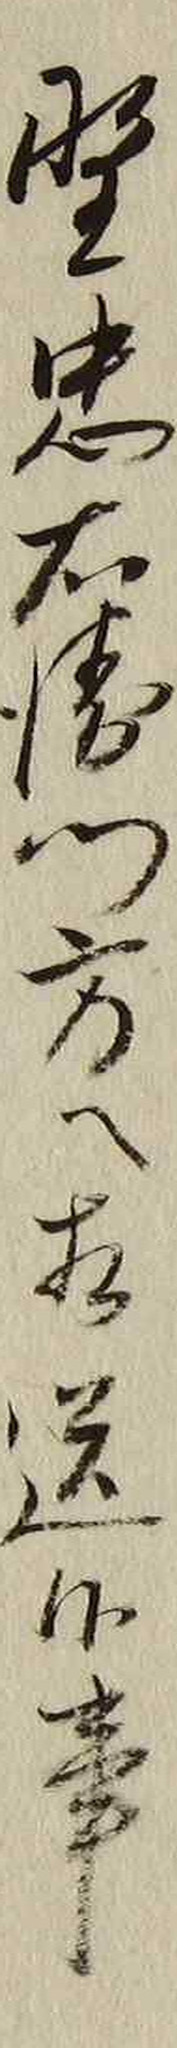野忠右衛門方へ相送候事
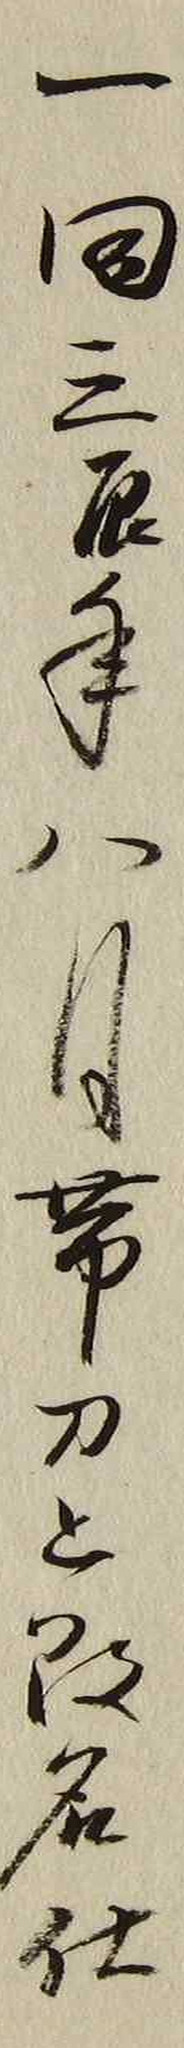一同三辰年八月帯刀と改名仕
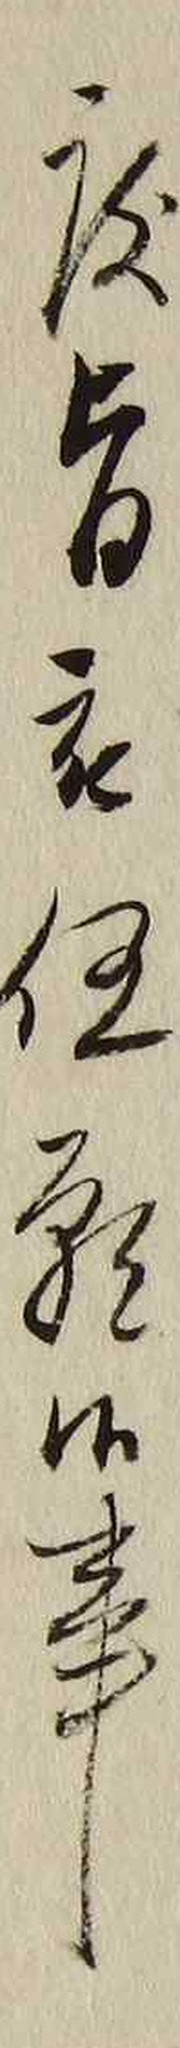度旨被任願候事
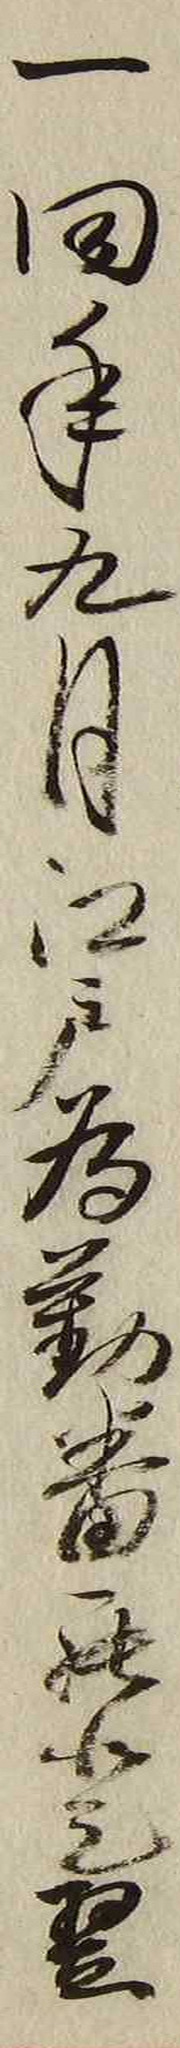一同年九月江戸為勤番罷登翌
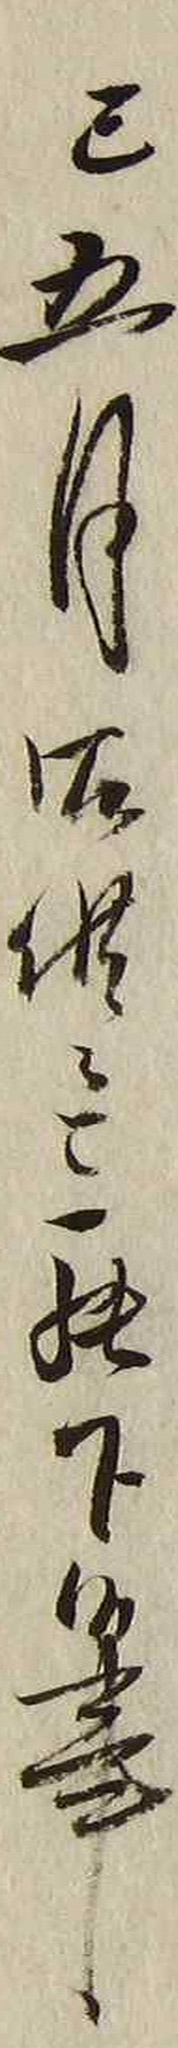巳五月御供ニて罷下候事

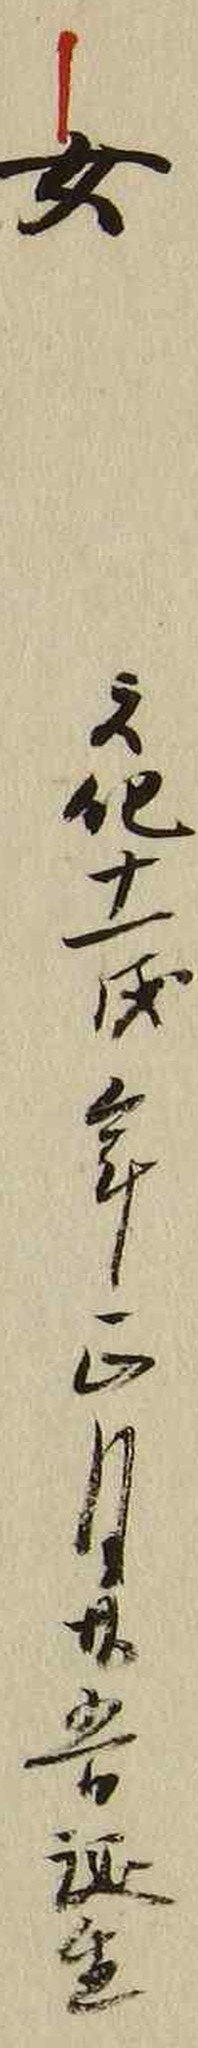女文化十一戌年正月廿五日誕生
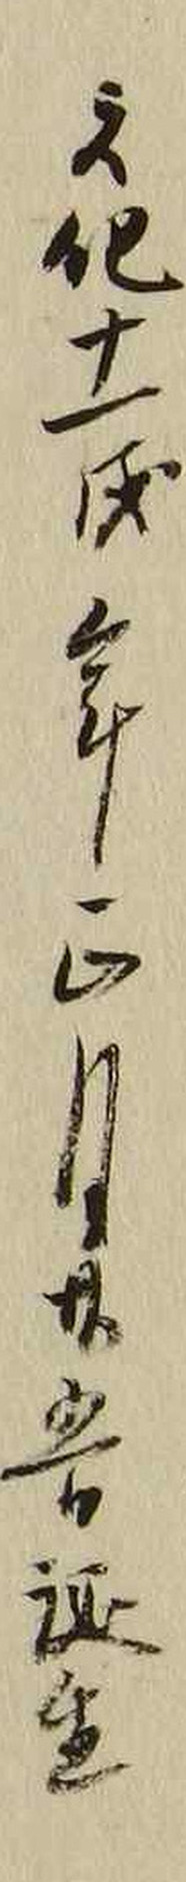女文化十一戌年正月廿五日誕生
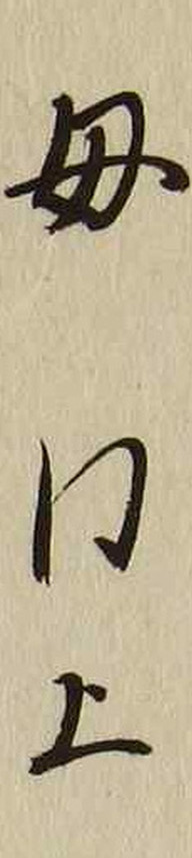母同上
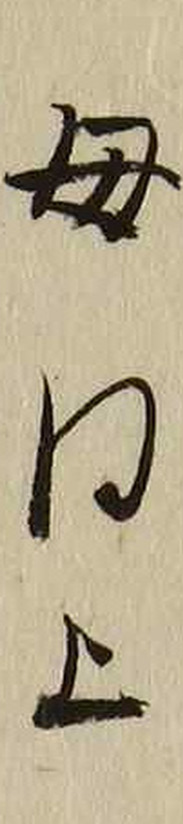母同上
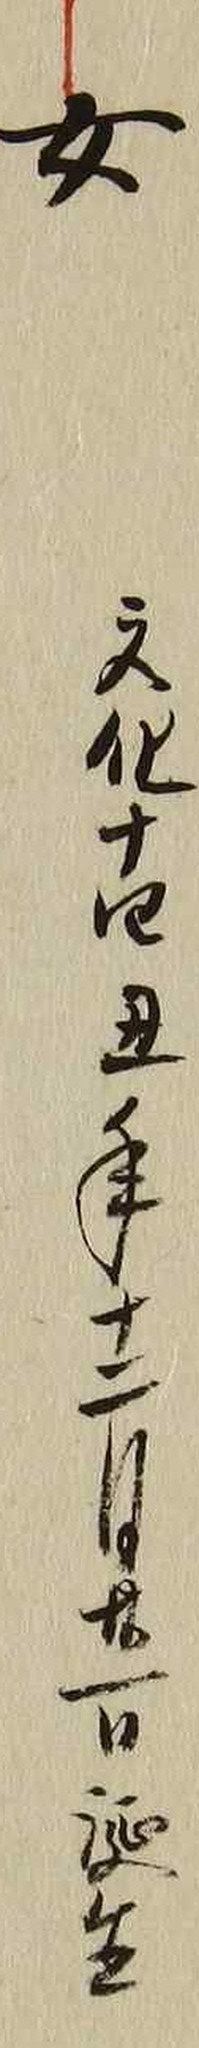女文化十四丑年十二月廿一誕生
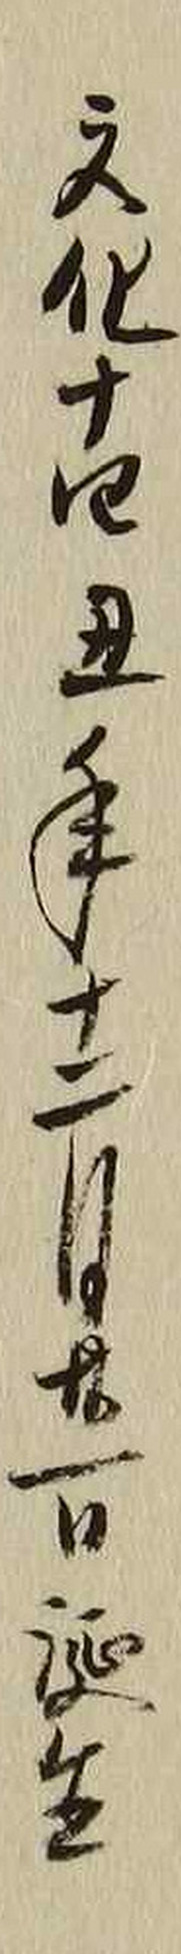女文化十四丑年十二月廿一誕生
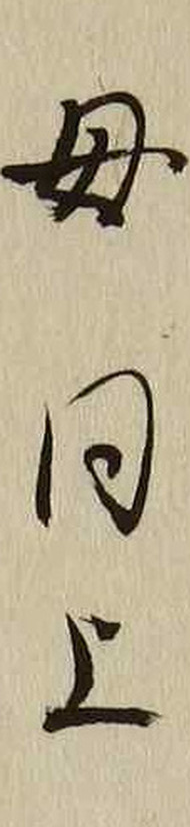母同上
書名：諸士系譜　巻之351　す之部1
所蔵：会津若松市立会津図書館
